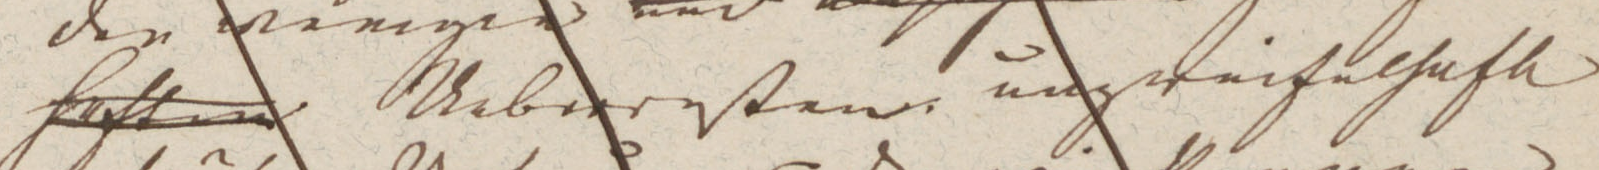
haften Ueberresten unzweifelhaft
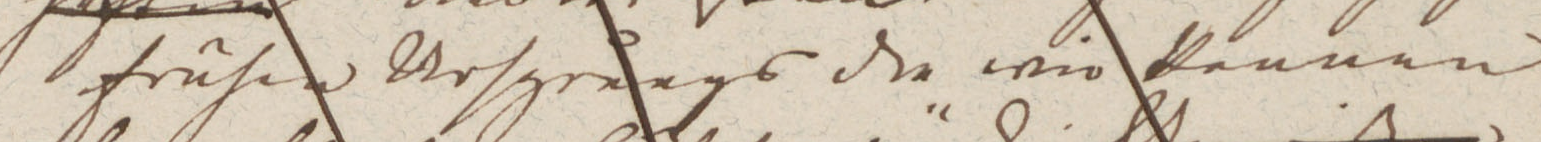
frühen Ursprungs die wir kennen
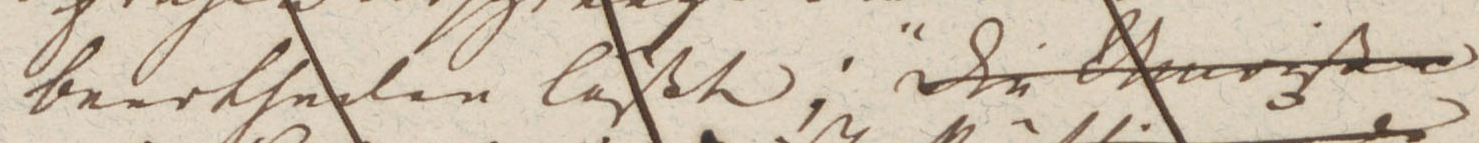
beurtheilen lässt; "Die Umrisse
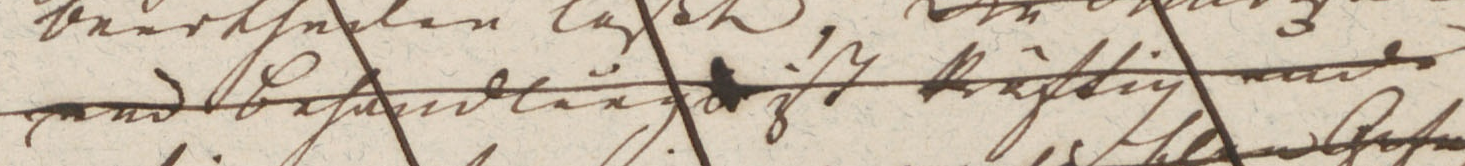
und Behandlung ist kräftig und
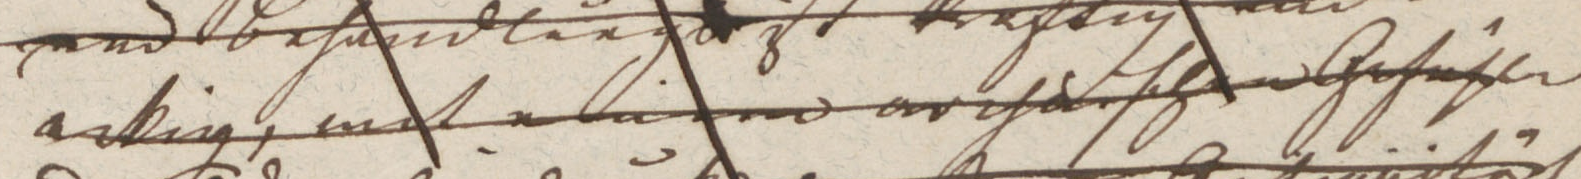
eckig, mit einem archaischen Gefühle
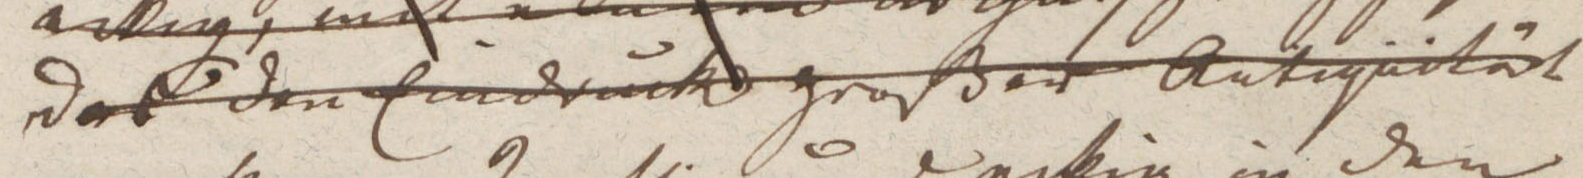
das den Eindruck grosser Antiquität
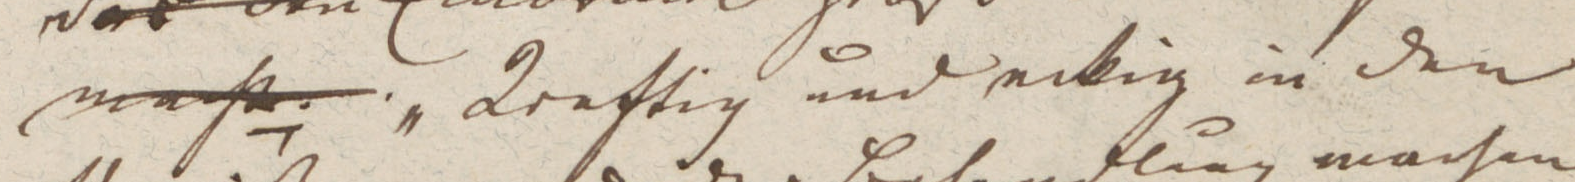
macht. "Kraftig und eckig in den
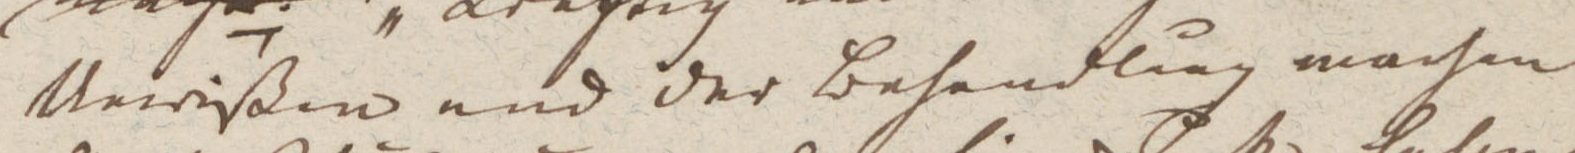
Umrissen und der Behandlung machen
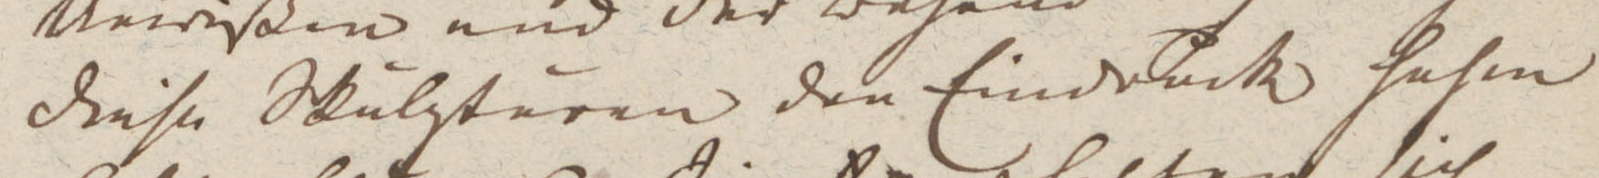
diese Skulpturen den Eindruck hohen
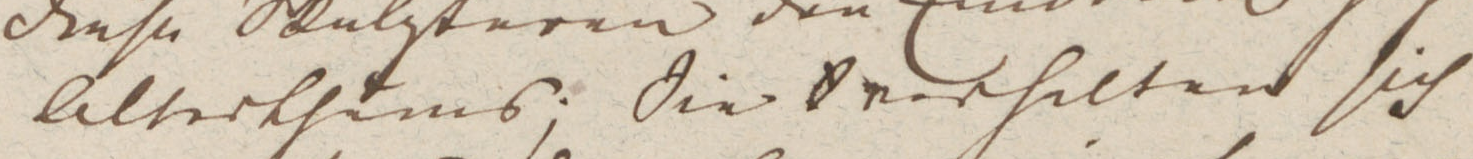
Alterthums; Sie verhalten sich
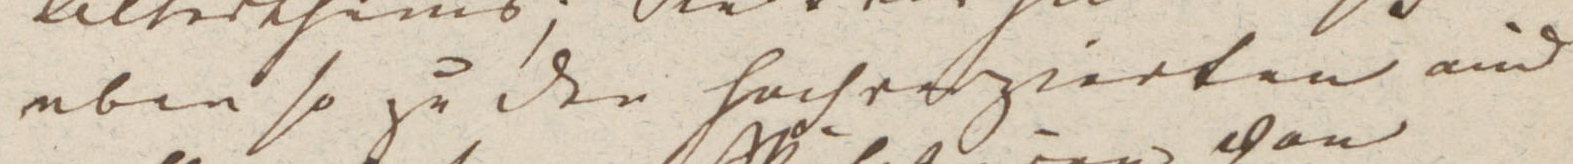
eben so zu den hochverzierten und
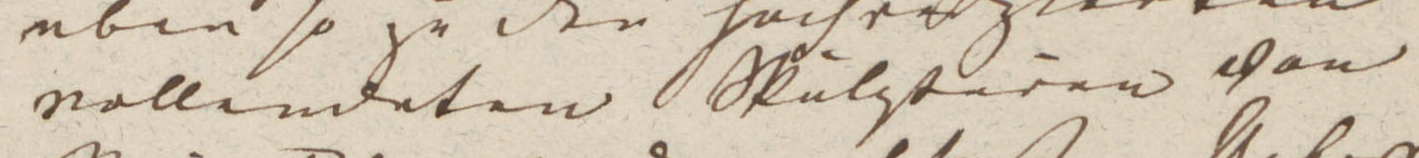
vollendeten Skulpturen von
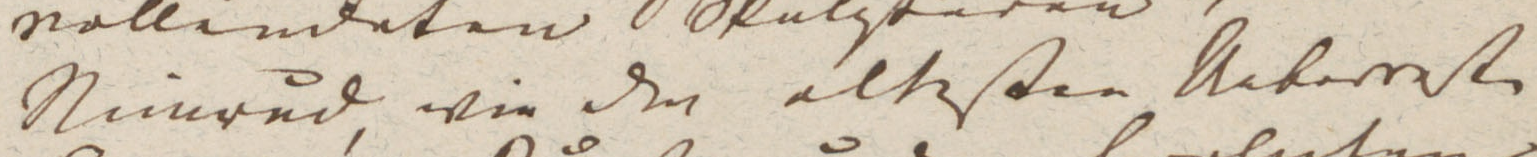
Nimrud, wie die altesten Ueberreste
